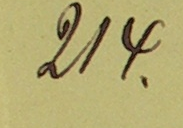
214
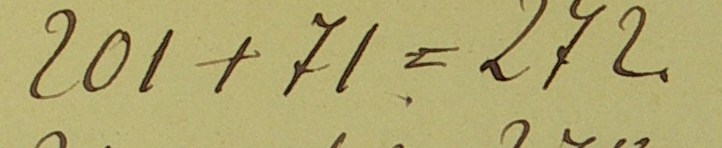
201 + 71 = 272
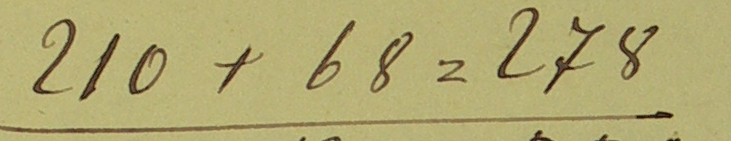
210 + 68 = 278
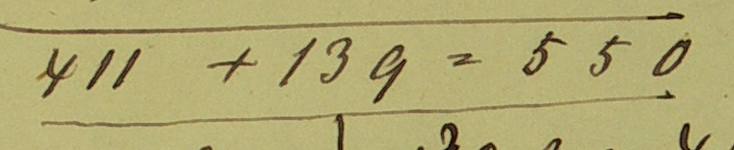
411 + 139 = 550
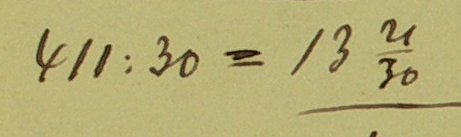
139 : 30 = 4 19/30
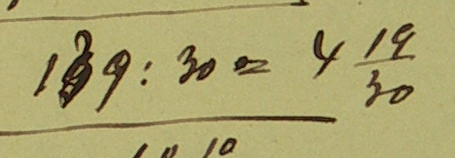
411 : 30 = 13 21/30
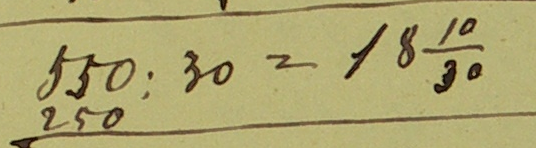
550 : 30 = 18 10/30
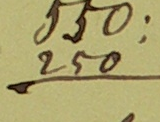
250
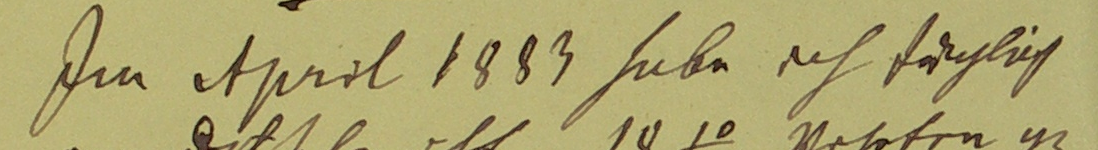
Im April 1883 habe ich täglich
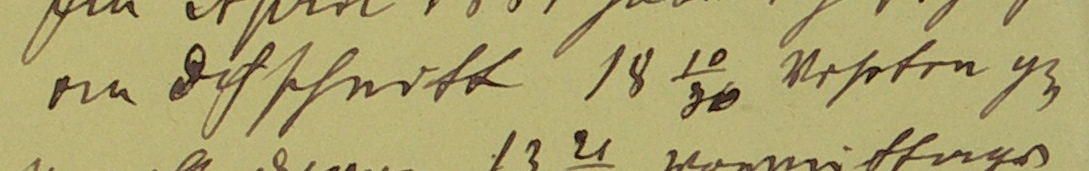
im Durchschnitt 18 10/30 Visiten ge¬
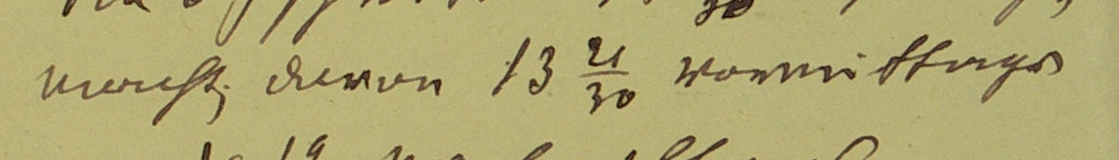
macht, davon 13 21(30 vormittags
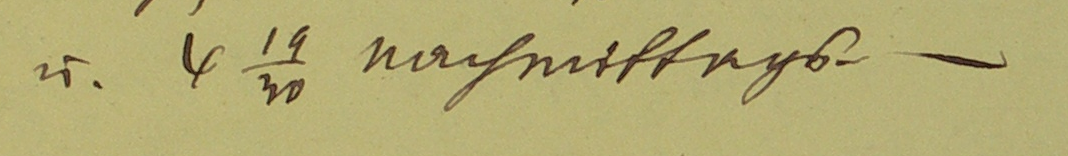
und 4 19/30 nachmittags.
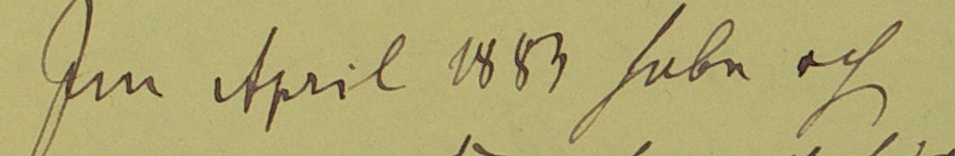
Im April 1883 habe ich
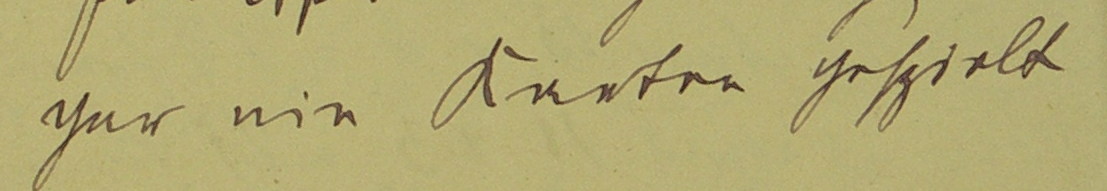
gar nie Karten gespielt.
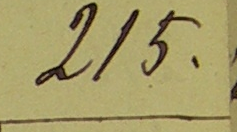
215
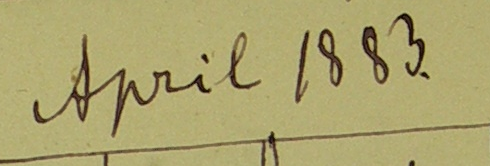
April1883
